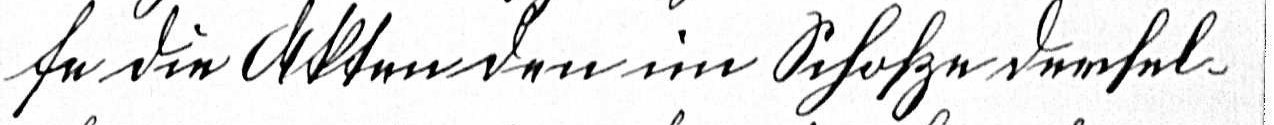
fe die Akten den im Schoße dersel¬
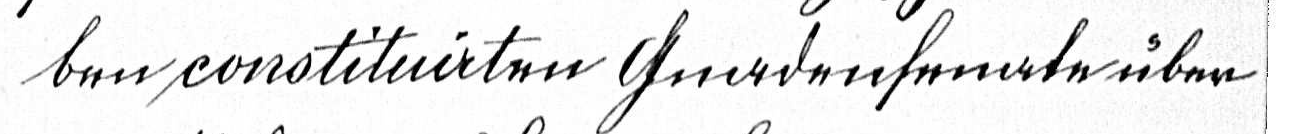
ben constituirten Gnadensenate über¬
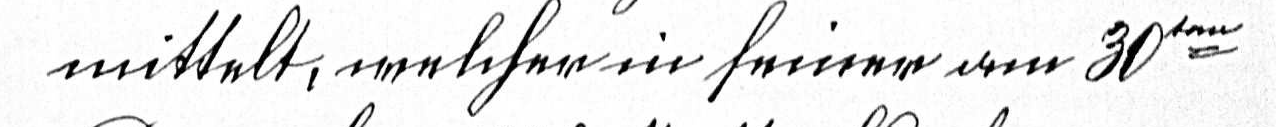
mittelt, welcher in seiner am 30ten
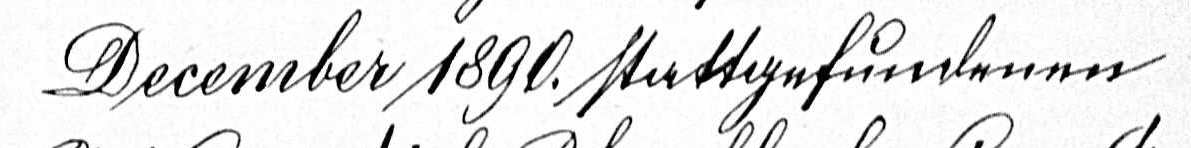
December 1890 stattgefundenen
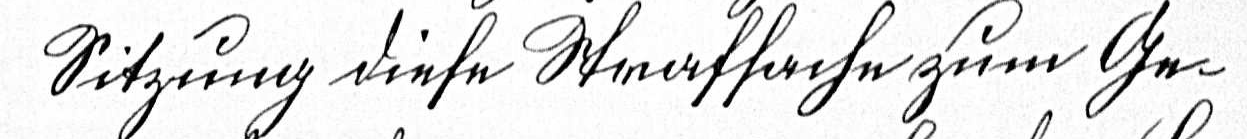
Sitzung diese Strafsache zum Ge¬
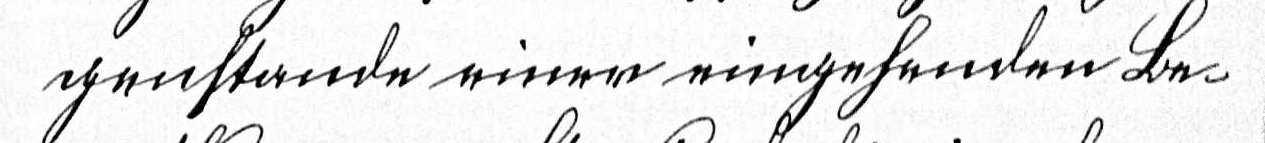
genstande einer eingehenden Be¬
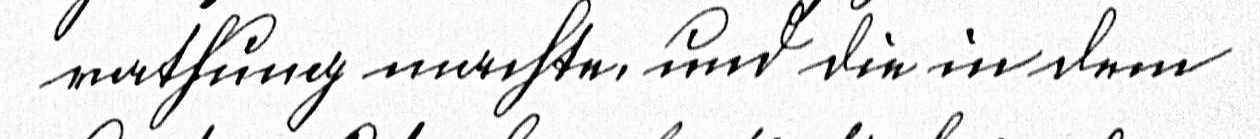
rathung machte, und die in dem
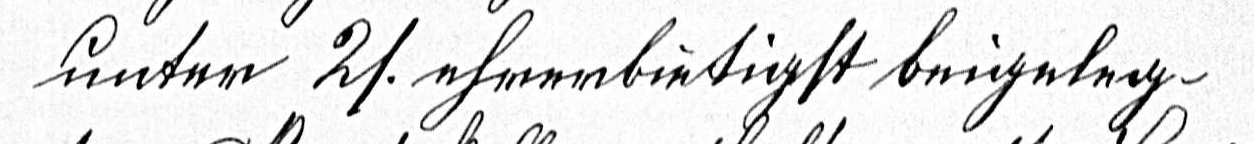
unter 2? Ehrerbietigst beigeleg¬
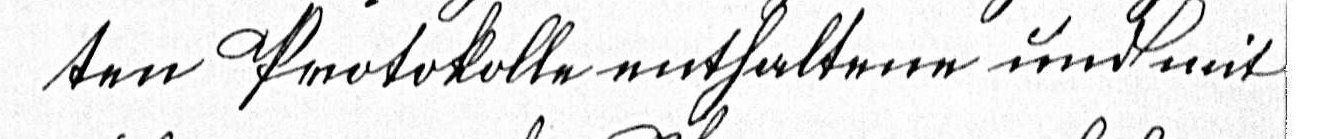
ten Protokolle enthaltene und mit
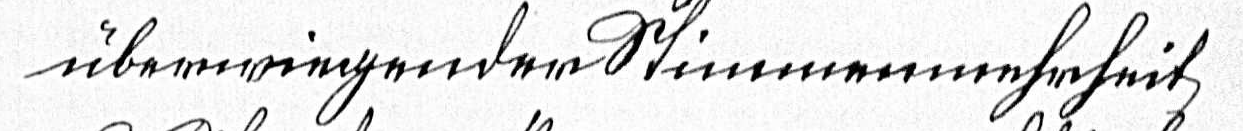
überwiegender Stimmenmehrheit
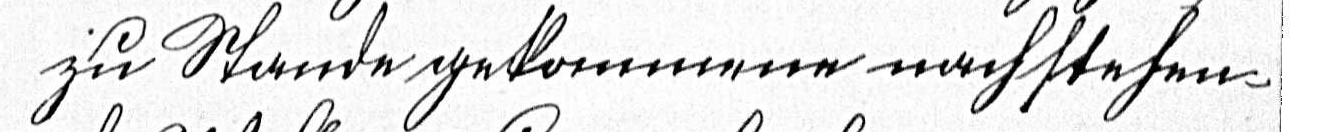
zu Stande gekommene nachstehen¬
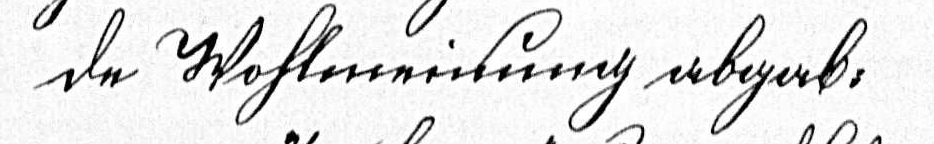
de Wohlmeinung abgab.
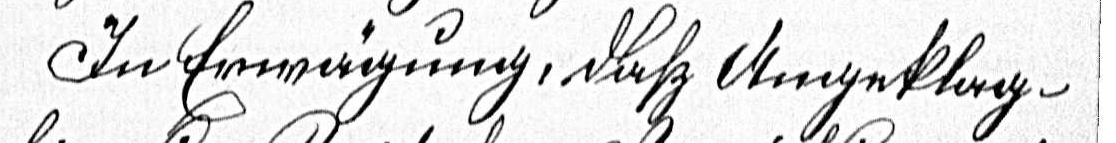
In Erwägung, daß Angeklag¬
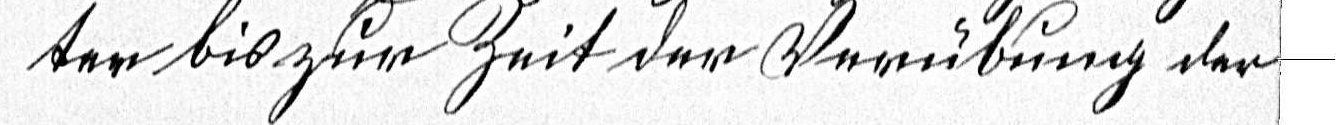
ter bis zur Zeit der Verübung der
